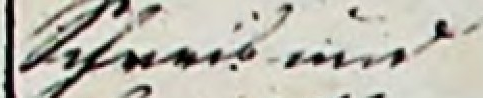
Schreib und
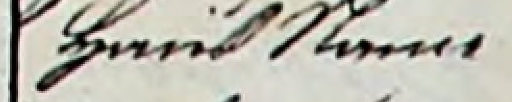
Haus Name
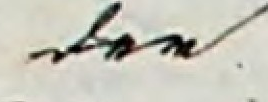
der
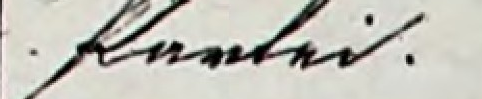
Partei.
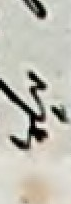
H???
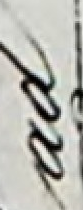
ad
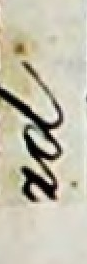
ad
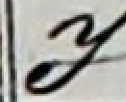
J.
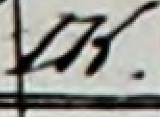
K.
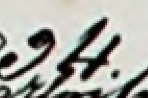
34
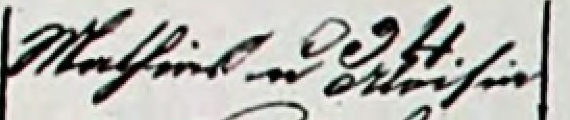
Mathias u Aloisia
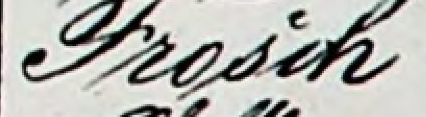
Frosch
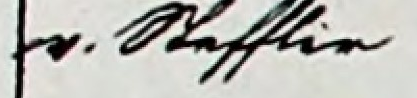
v. Steffler
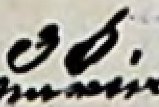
36
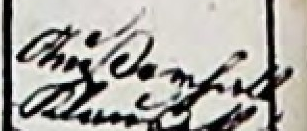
Außerhalb
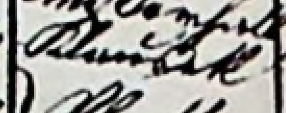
Klausek
